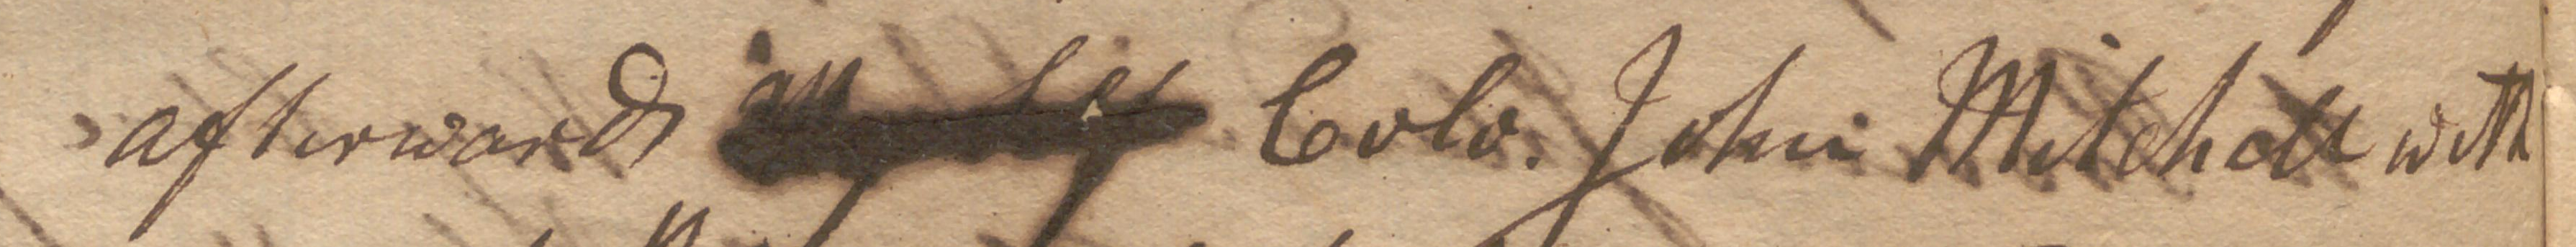afterwards [________] Colo. John Mitchell with
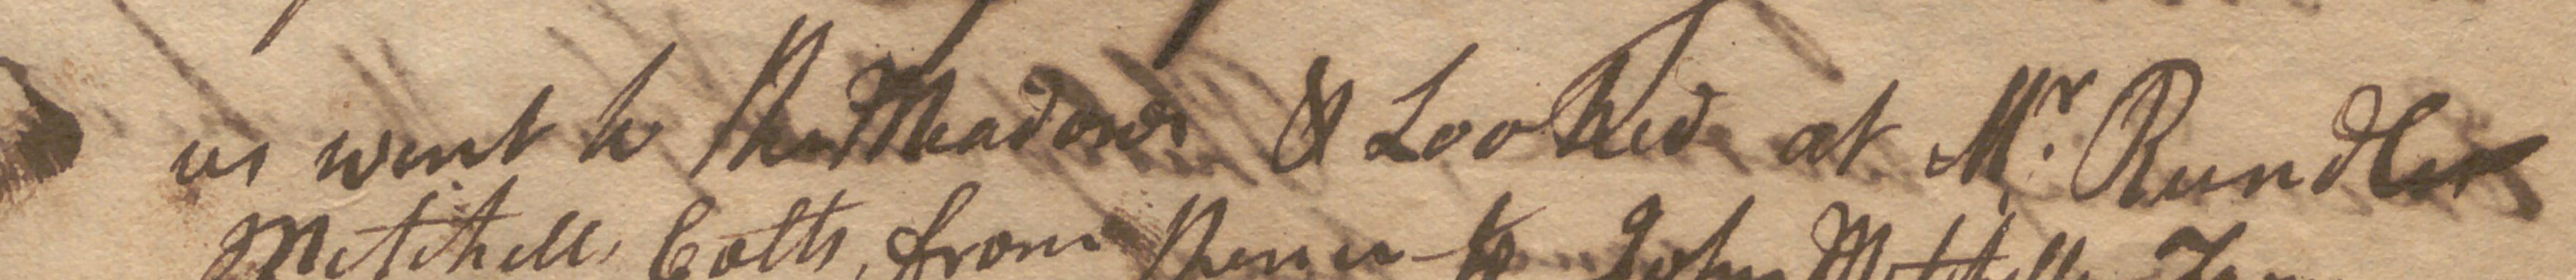us went to the Meadows & Looked at M^r. Rundles
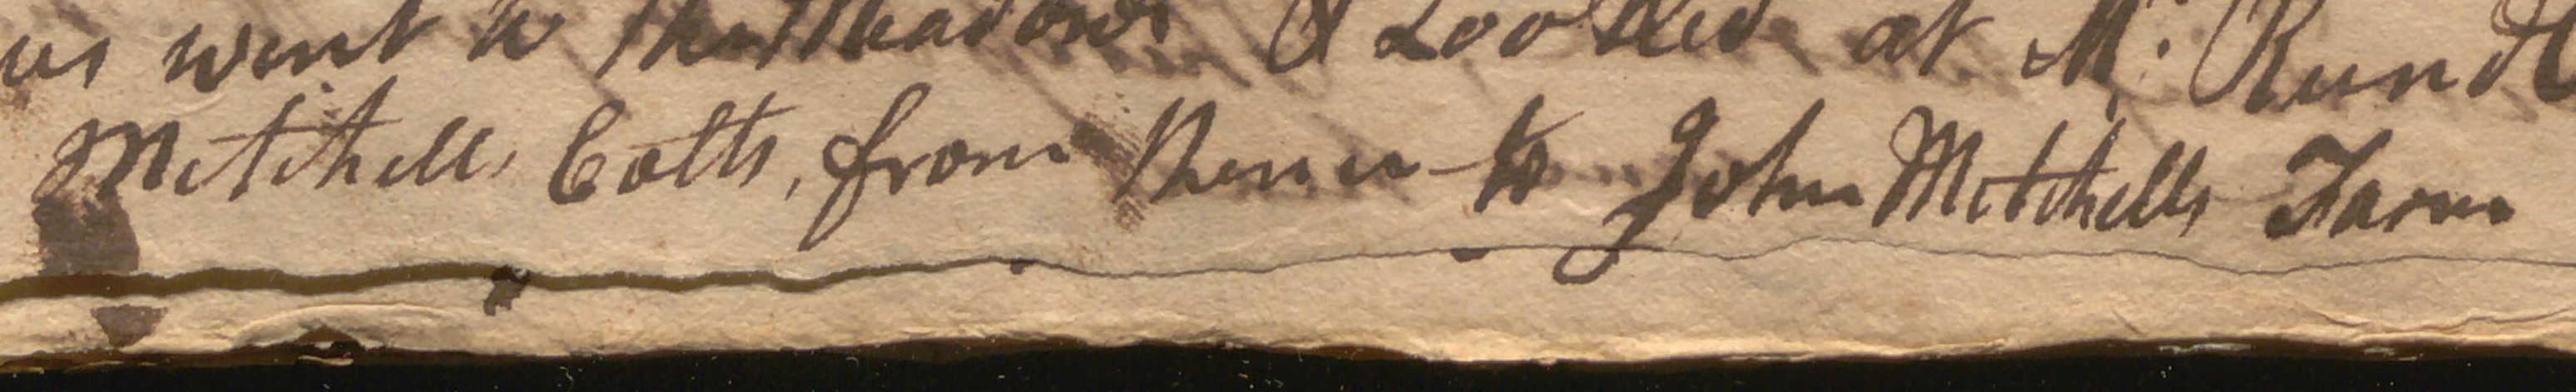Mitchells Colts, from thence to John Mitchells Farm
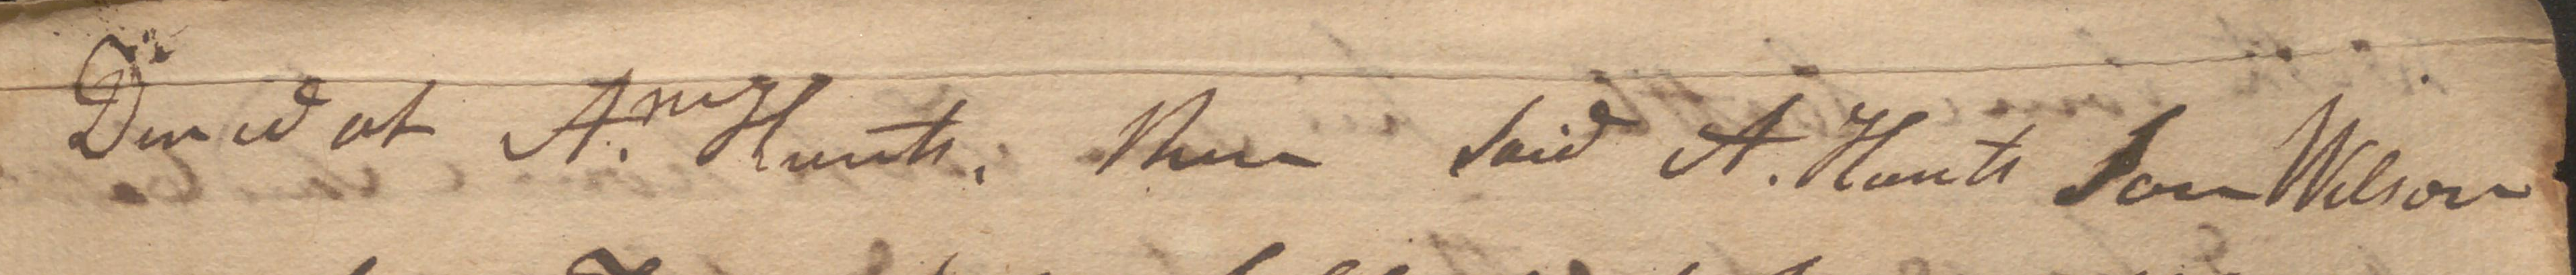Dined at A^m. Hunts, there said A. Hunts Son Wilson
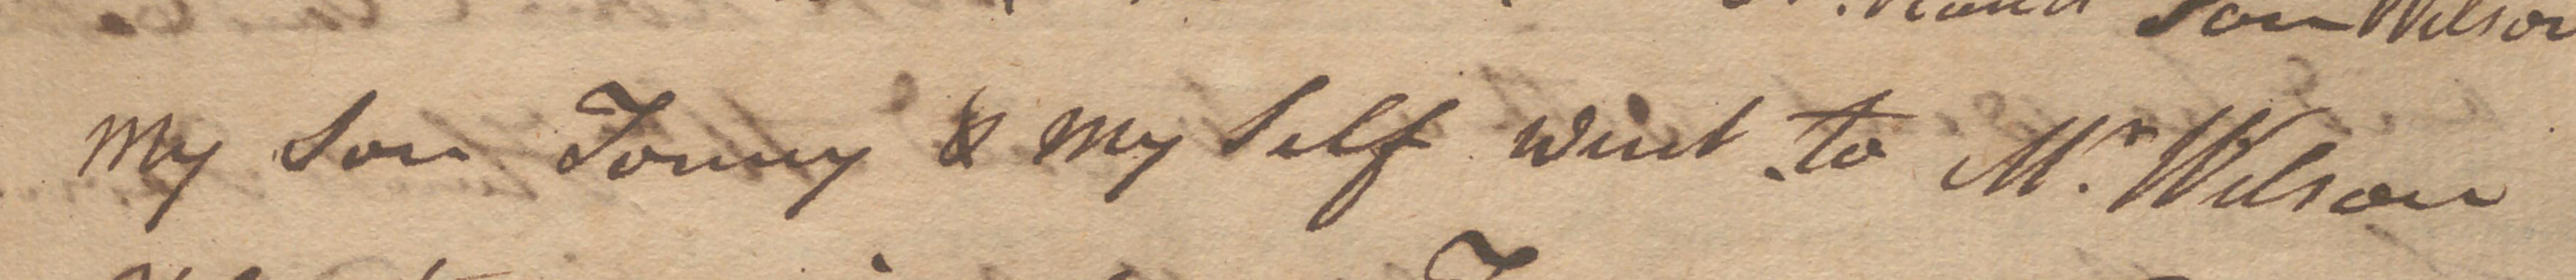My Son Tomey & my self went to M^r. Wilson
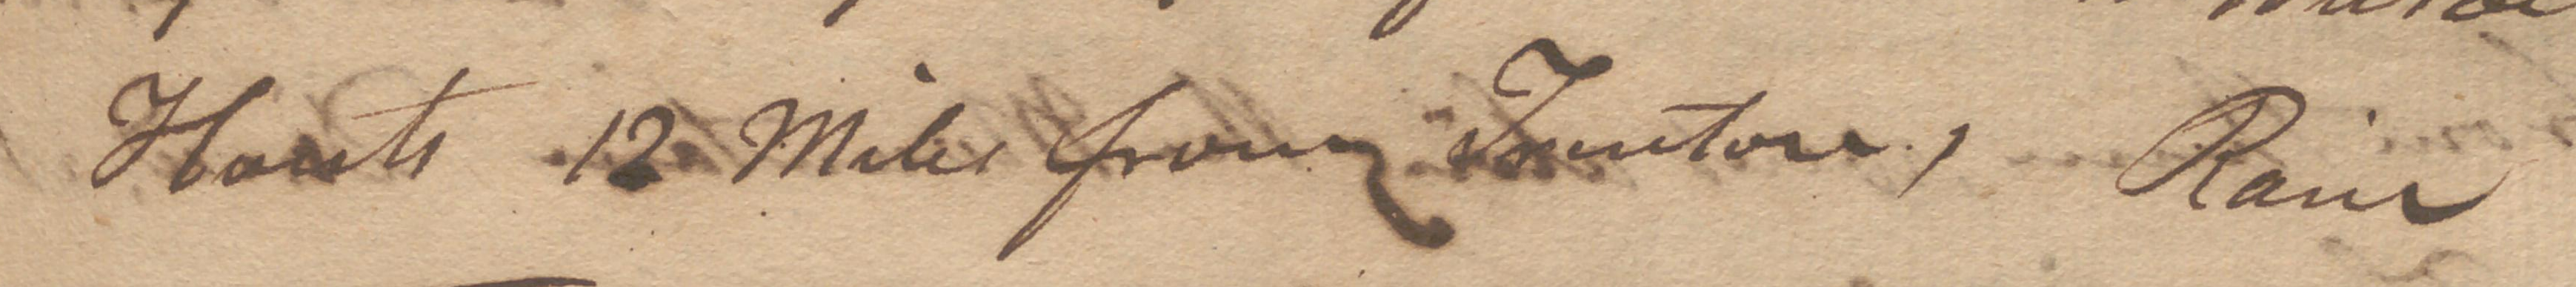Hunts 12 Miles from Trenton, Rain
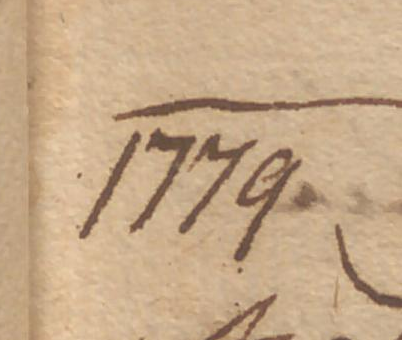1779.
